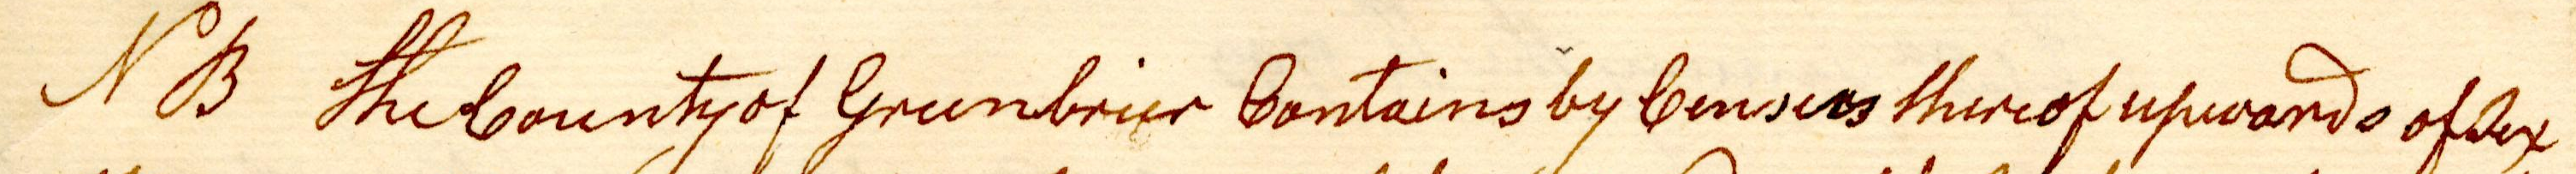N B The County of Greenbriar Contains by Censers thereof upwards of Six
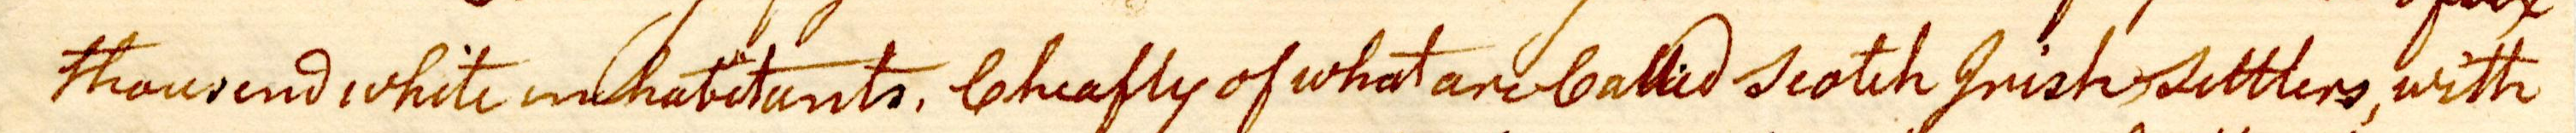thousend white inhabitants. Cheafly of what are Called scotch Irish settlers, with
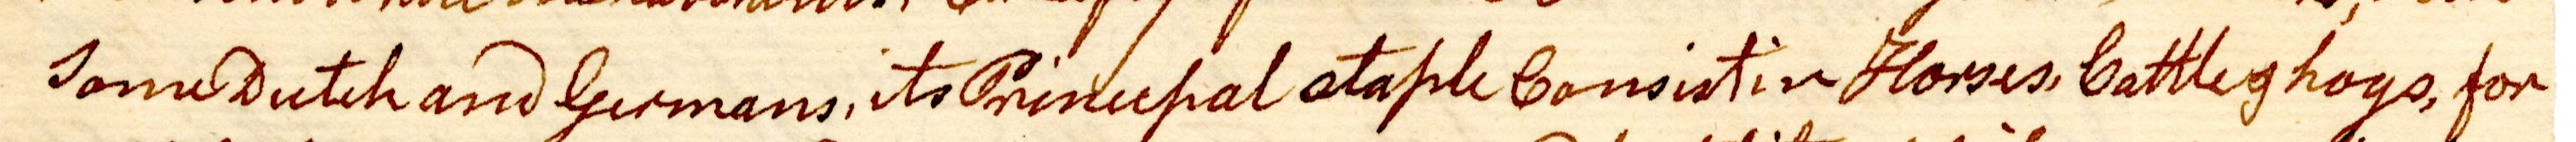some Dutch and Germans, its Principal staple Consist in Horses Cattle'g hogs, for
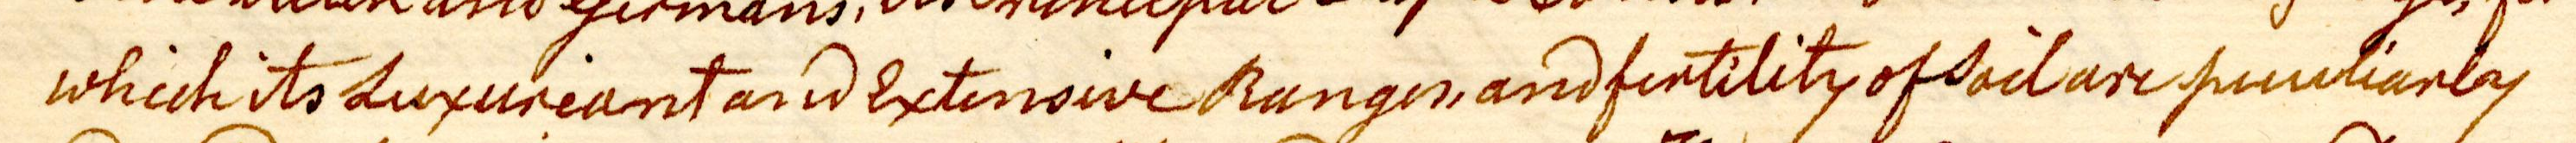which its Luxuriant and and Extensive Ranges, and fertility of soil are particularly
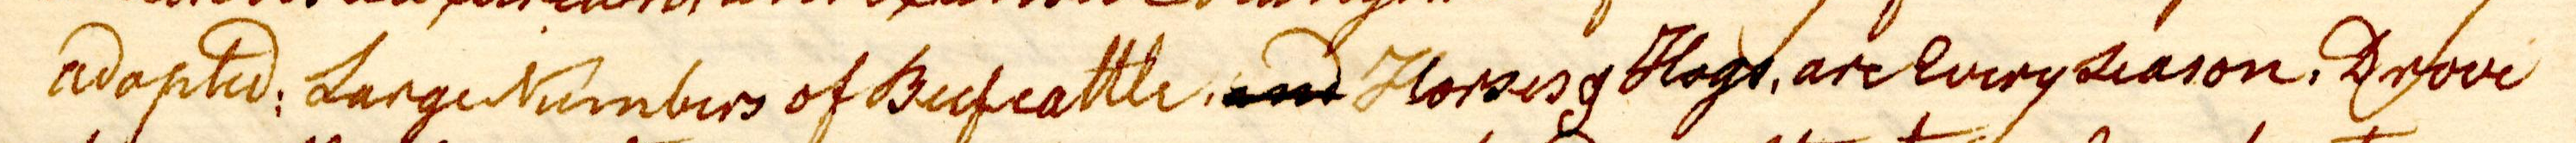adapted; Large numbers of Beef cattle, [and] Horses & Hogs are Every season Drove
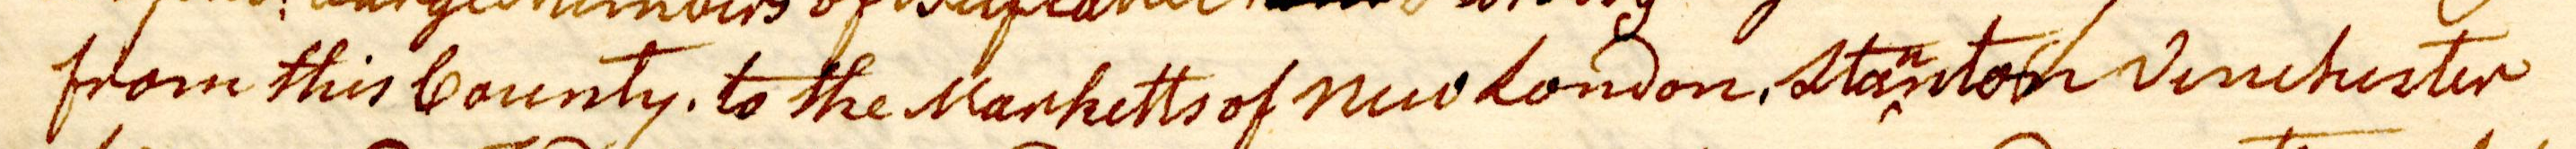from this County to the Markets of New London, Stanton Vinchester,
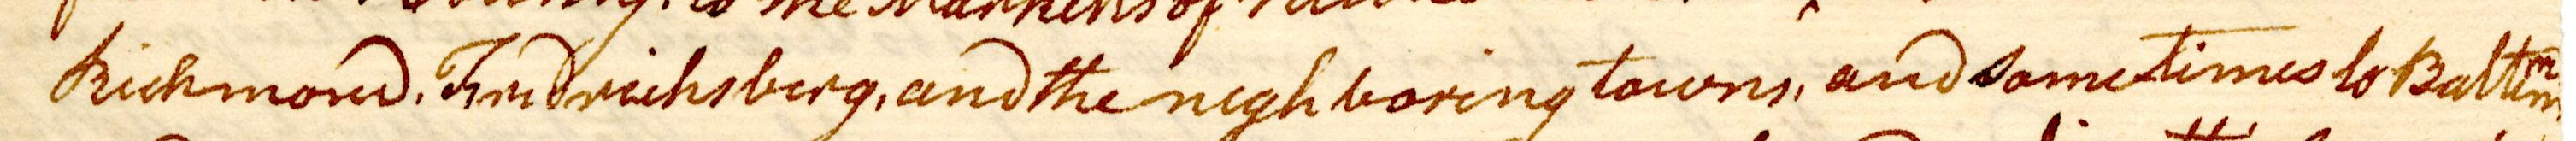Richmond, Fredricksberg, and the neighboring towns, and sometimes to Baltimore
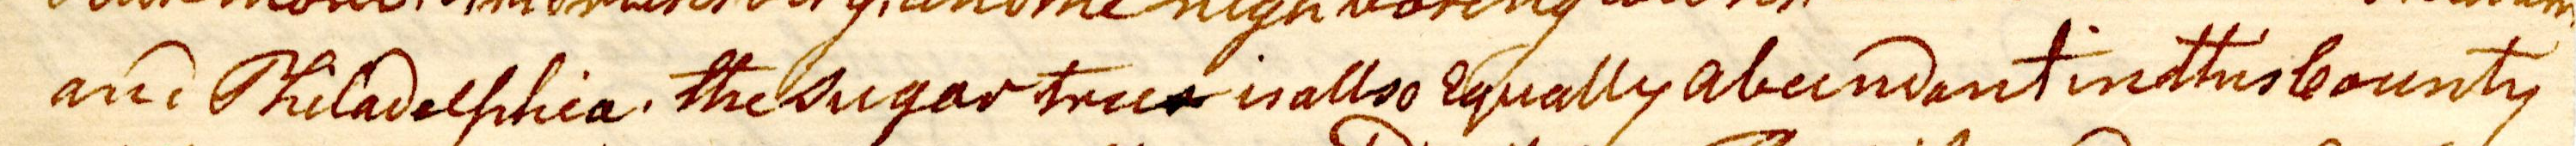and Philadelphia, the sugar trees is allso equally abundant in this County
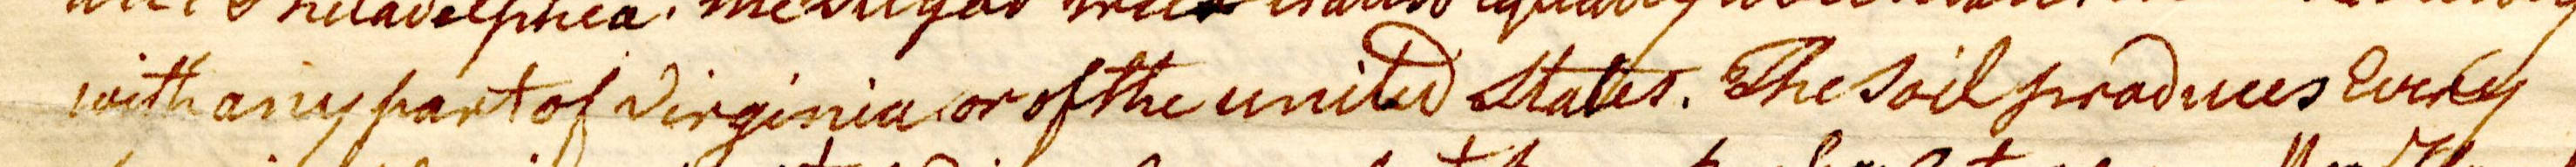with any part of Virginia or of the united States. The soil produces Every
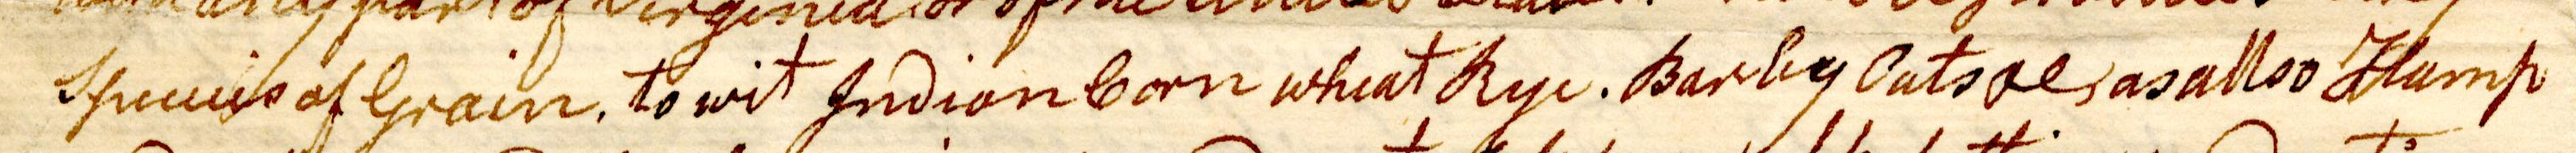species of Grain, to wit Indian Corn wheat Rye Barley Catsae as allso Hemp
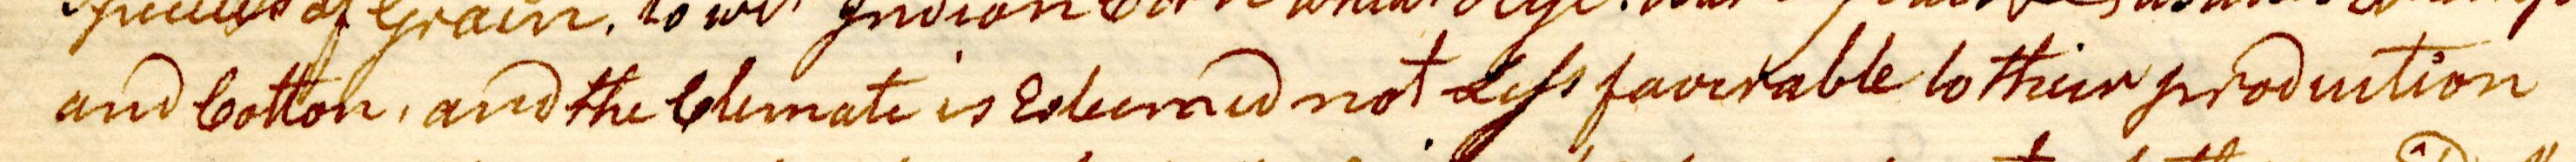and Cotton, and the climate is Eteemed not Less favorable to their production
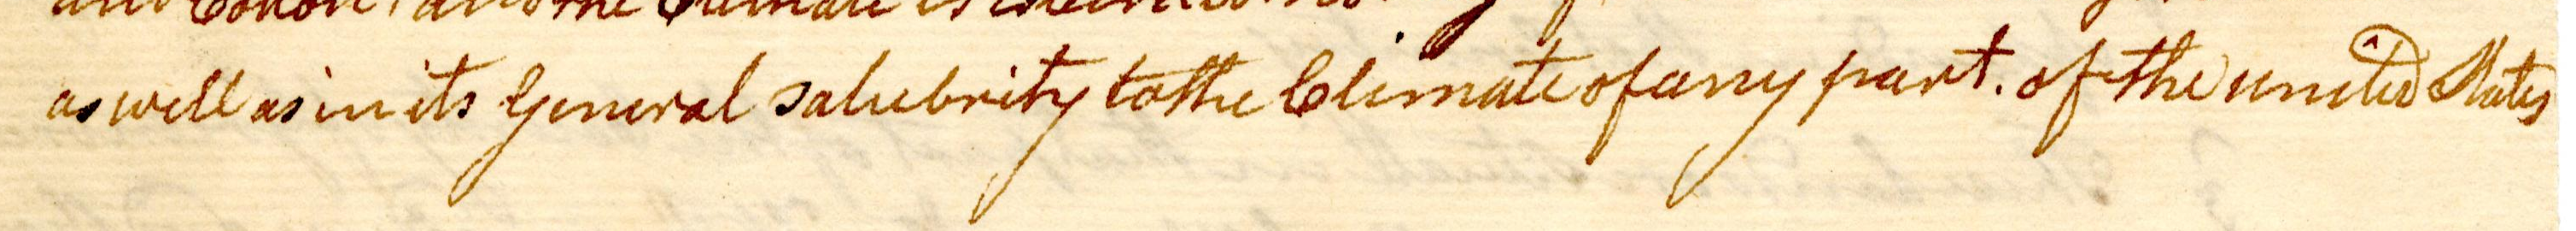as well as insists General salubrity to the climate of any part of the United States
